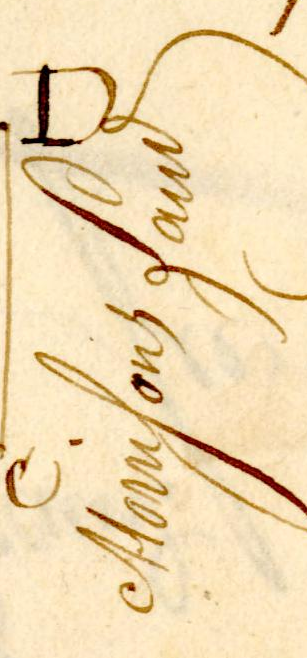Hornsons Land
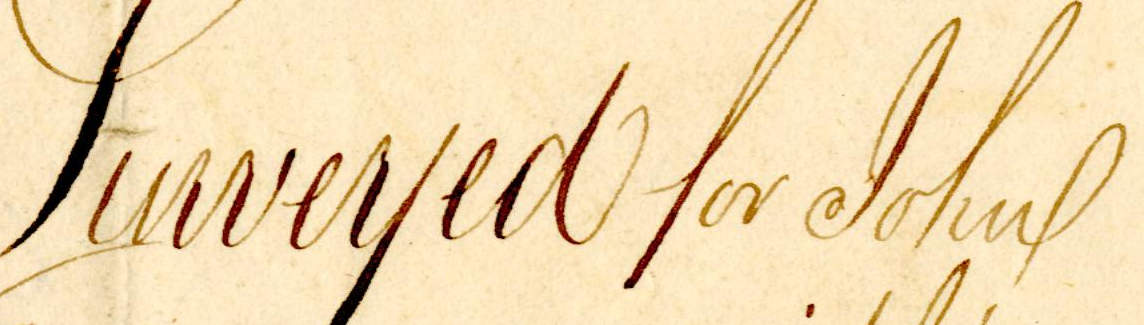Surveyed for John
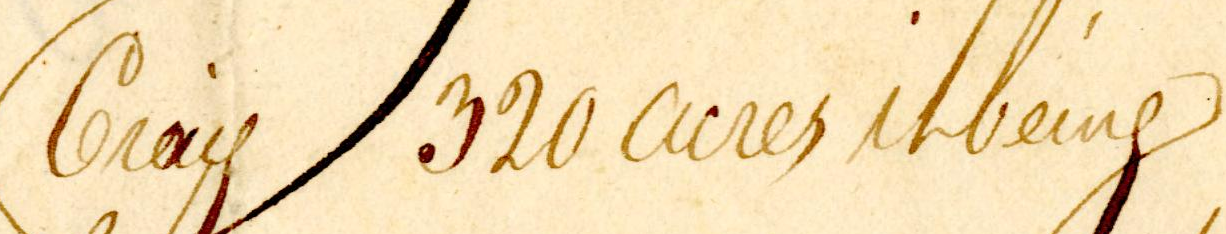Craig 320 Acres it being
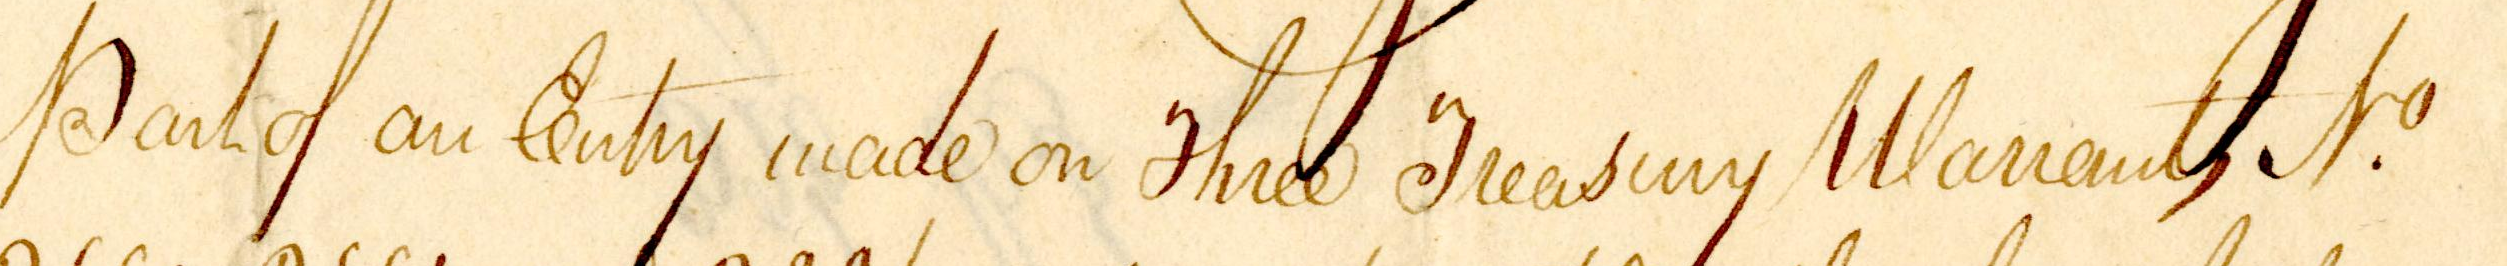Part of an Entry made on Three Treasury Warants, N^o.
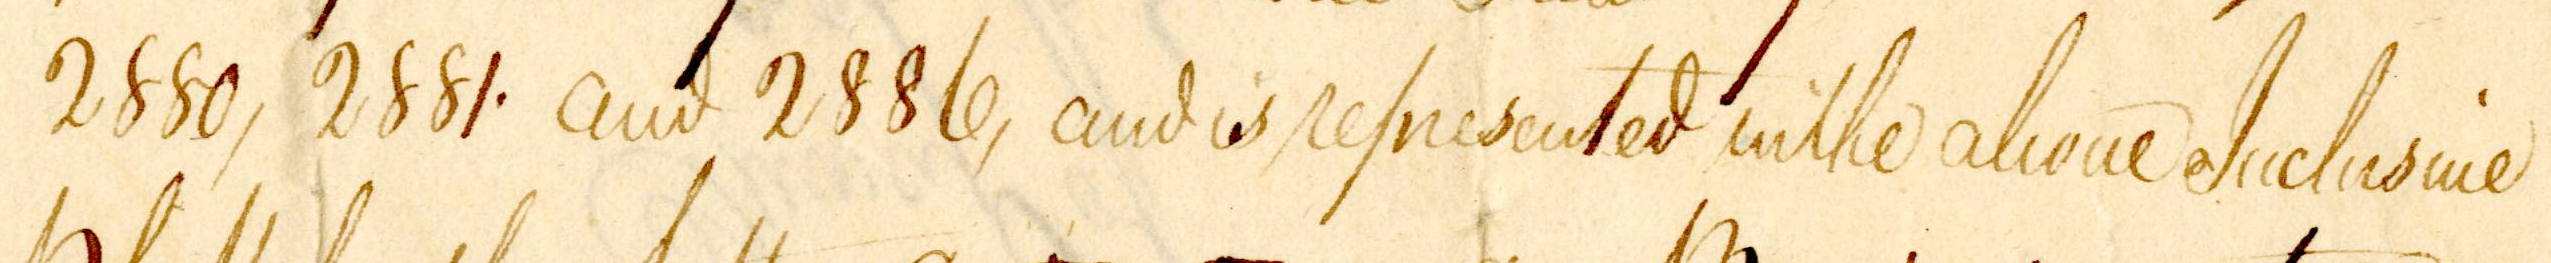2880, 2881. and 2886, and is represented withe above Inclusive
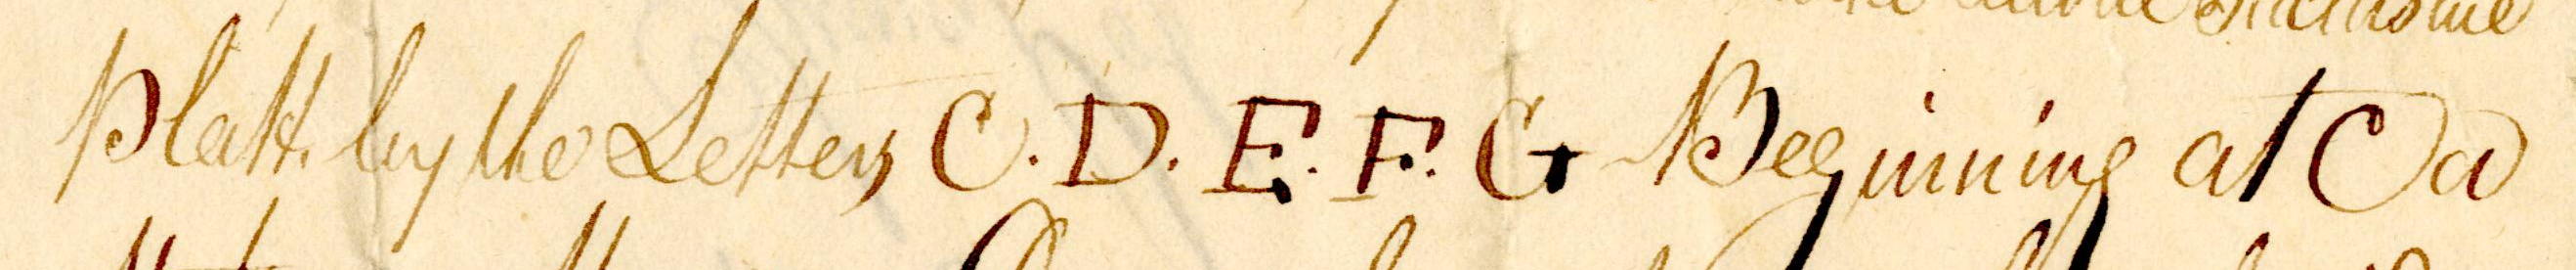Platt by the Letters C.D.E.F.G Beginning at C a
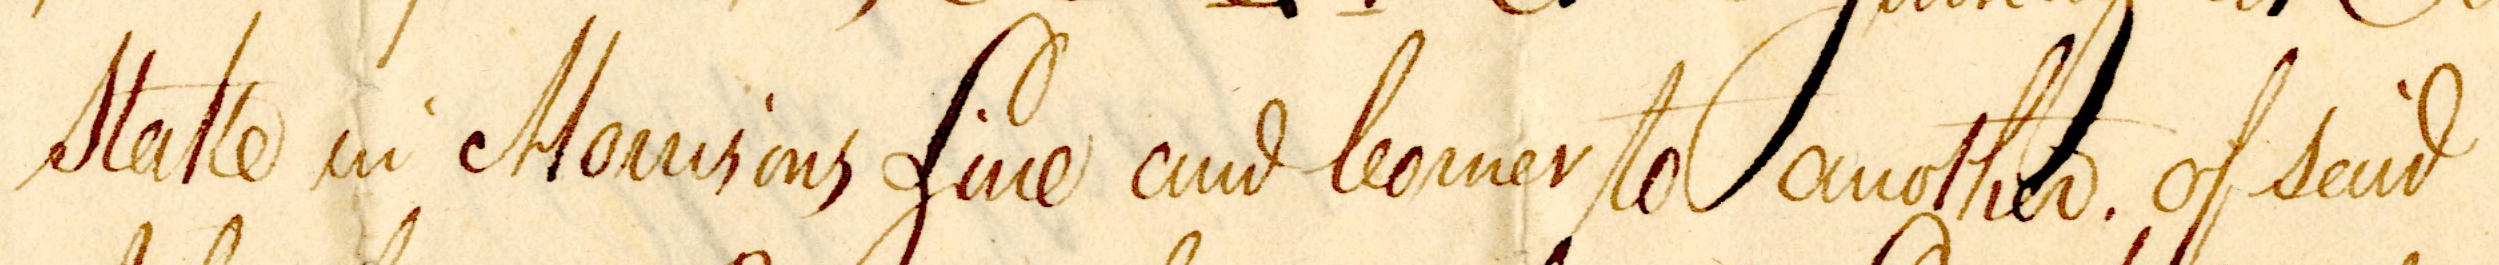Stake in Mansions five and Corner to another. of said
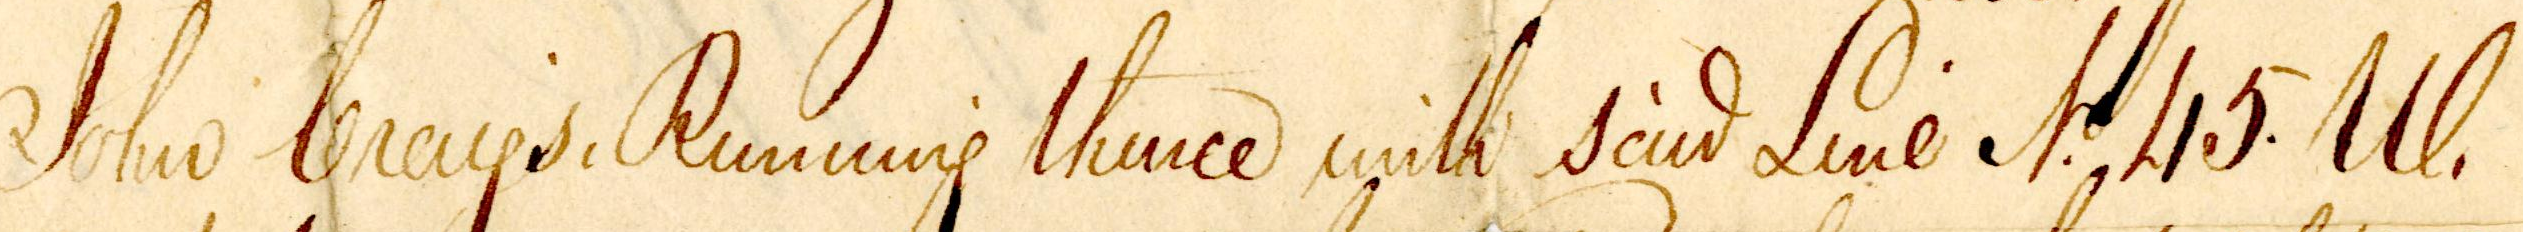John Craigs. Running thence with said Line N. 45. Ul.
